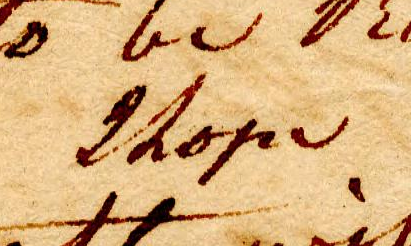I hope
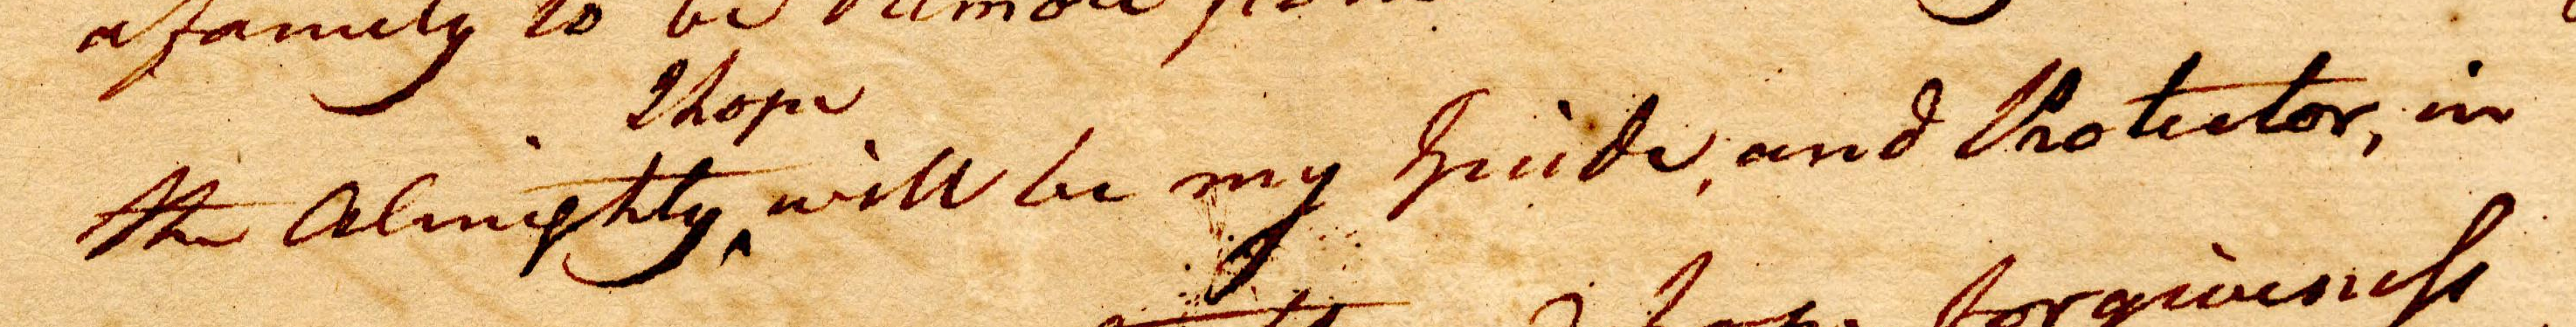the almighty ^ will be my guide, and protector, in
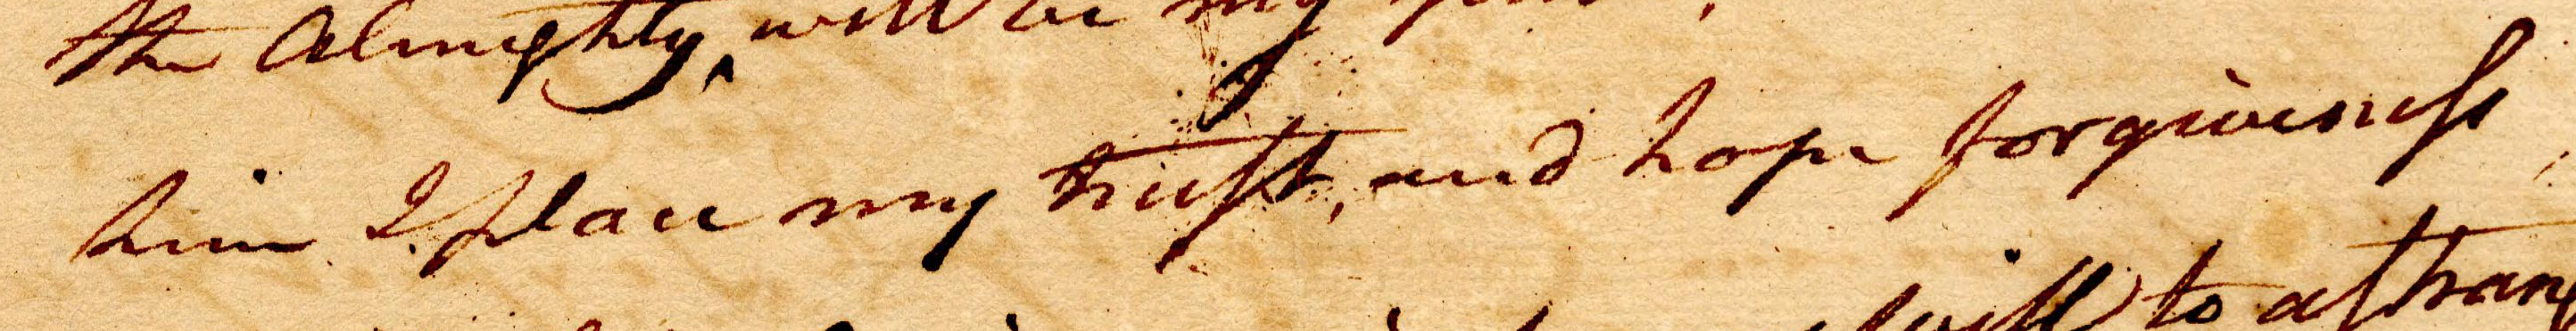him I place my trust, and hope forgiveness
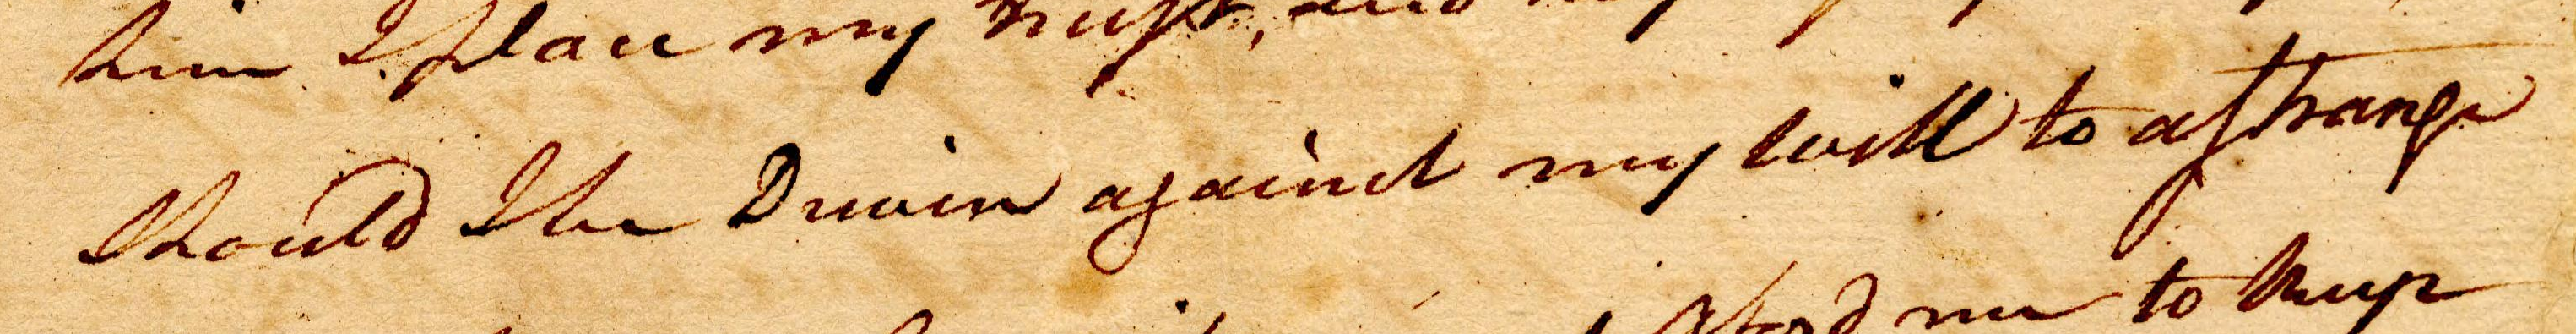should I be Drawn against my will to a strange
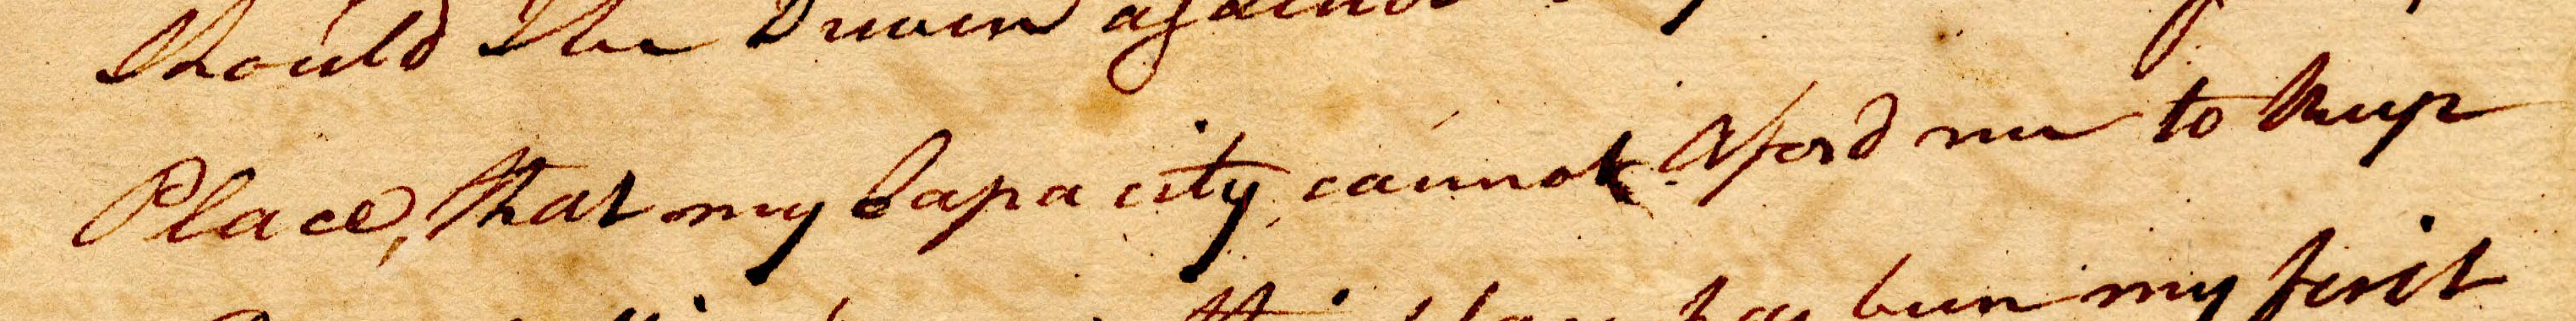Place, that my capacity cannot Aford me to hope
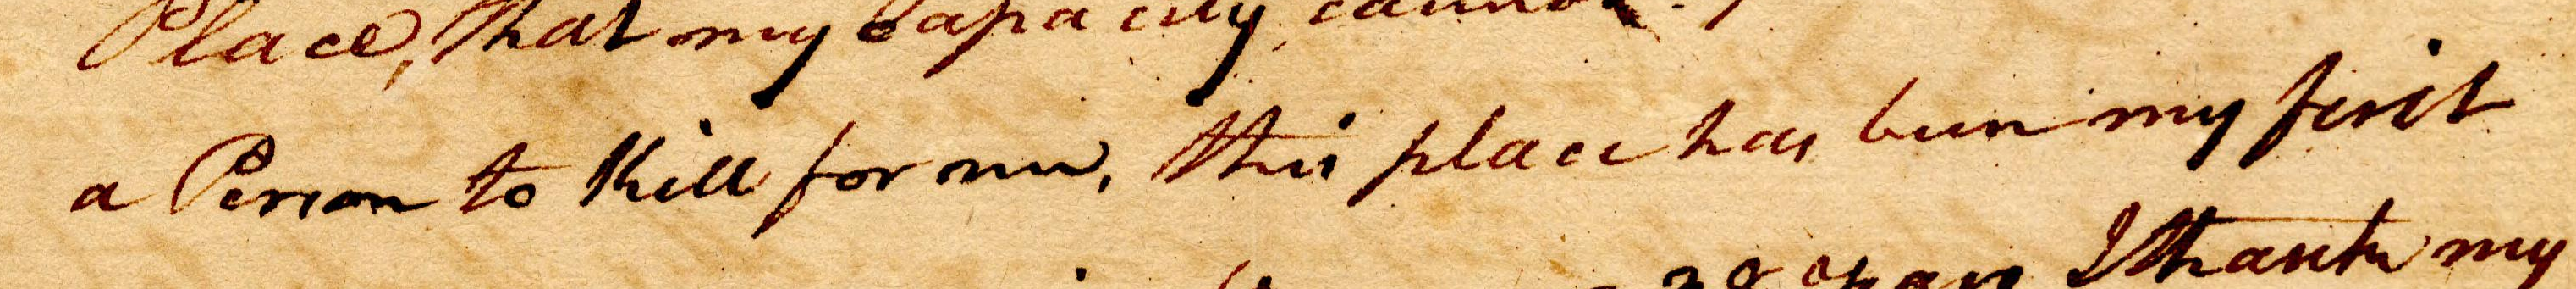a Person to Kill for now, this place has been my first
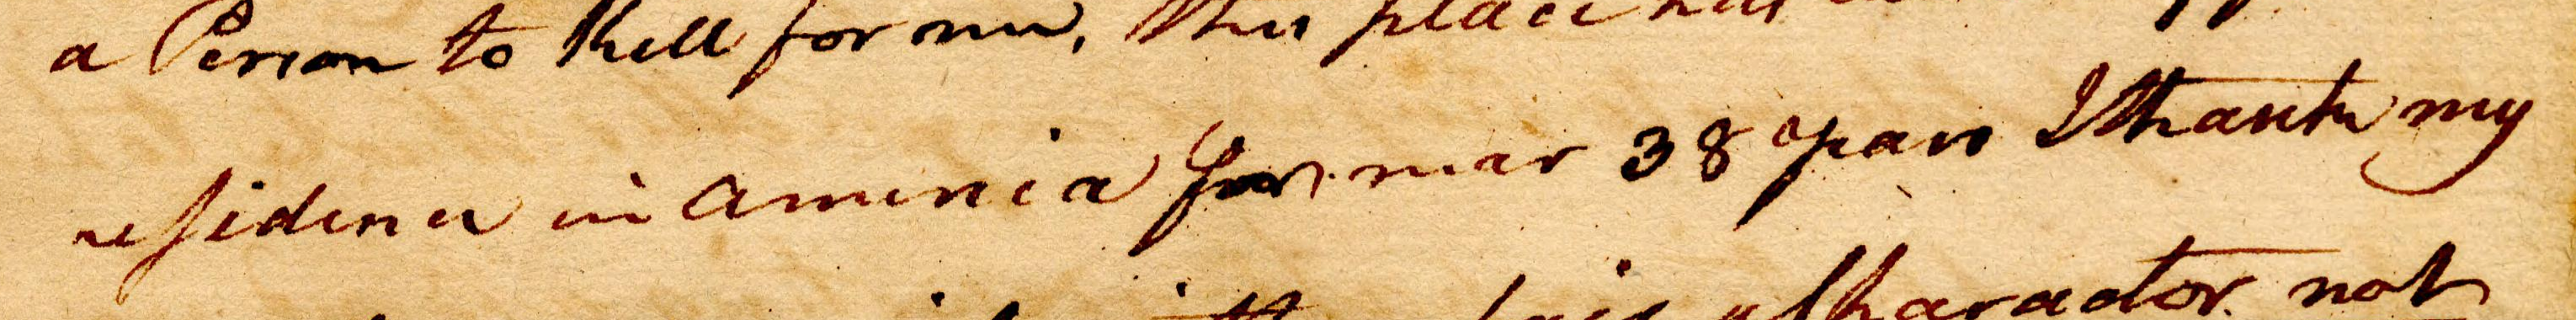residence in America for near 38 years I thank, my
